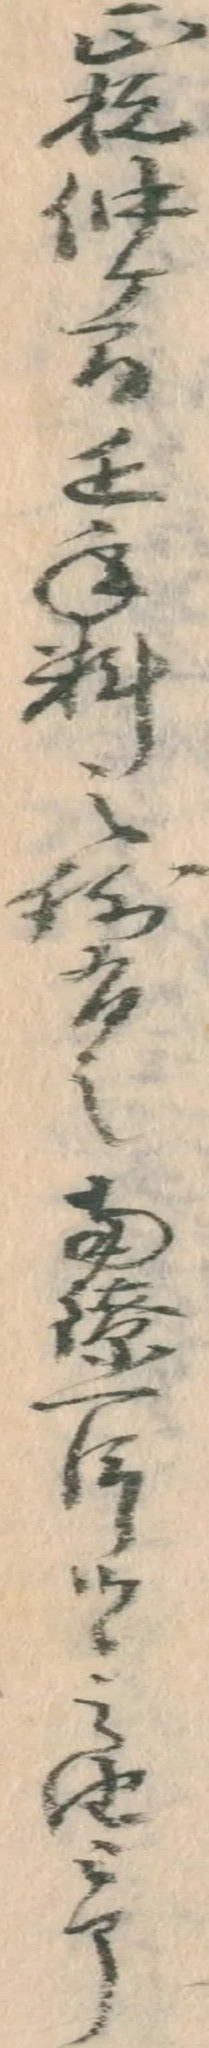正税仲ヶ間近年料之綿有之南鐐一片ツヽ之由御了

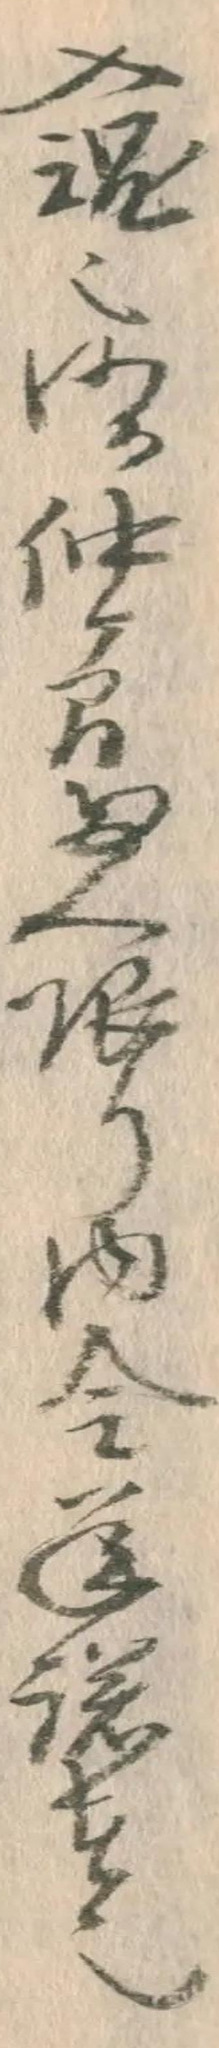入魂也仍而仲ヶ間両人限り内令承諾在也
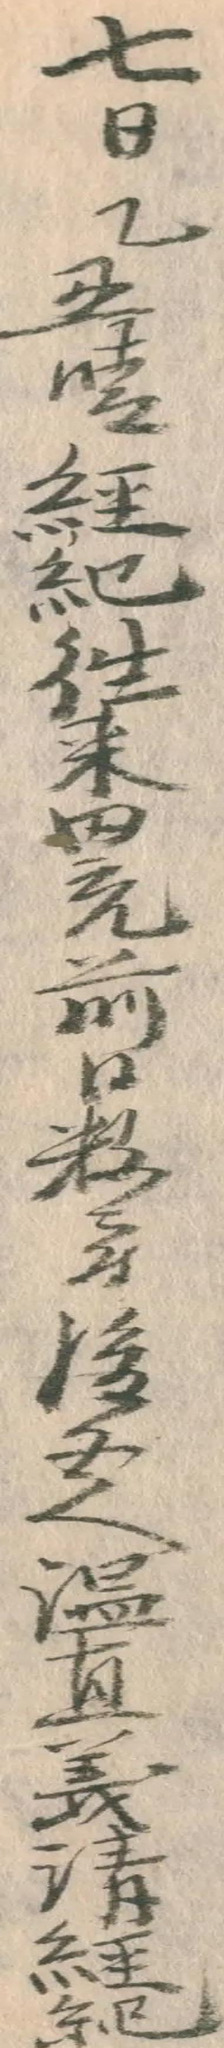七日乙丑晴経紀往来田充前日数ニ付後五人温直義清経紀
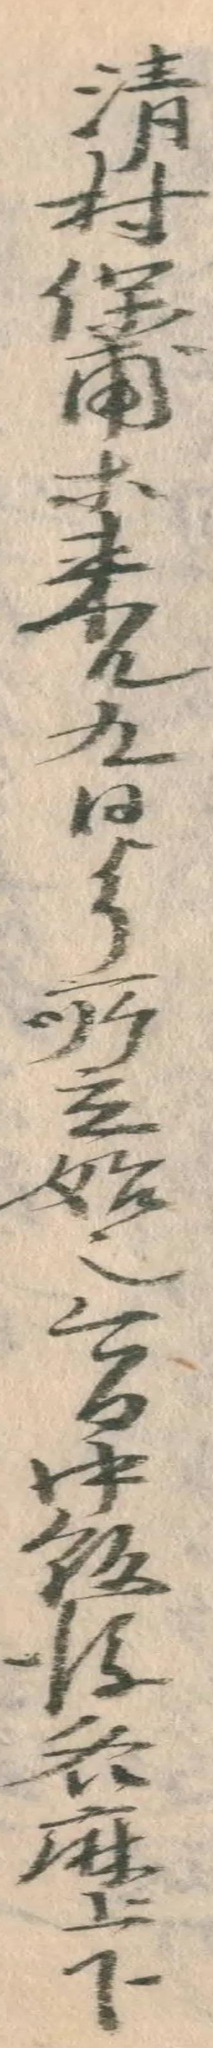清村保甫等来ル九日より所立始也今日中飯後各麻上下
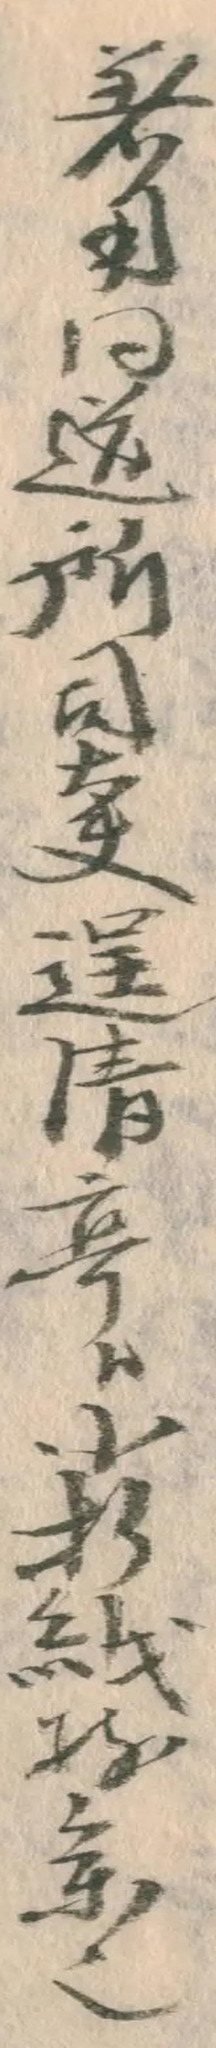着用同道所司大夫逞清亭え小折紙持参也
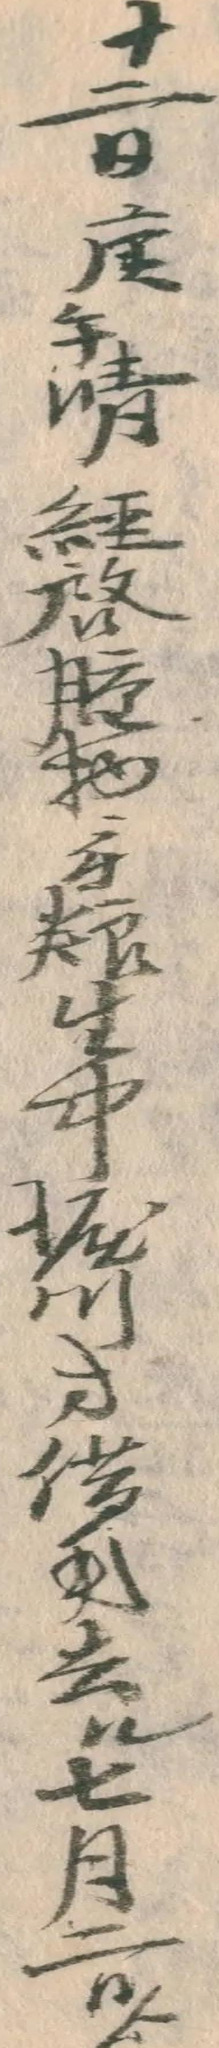十二日庚午晴経啓腫物ニ付養生中堀川方借用去ル七月二日ゟ
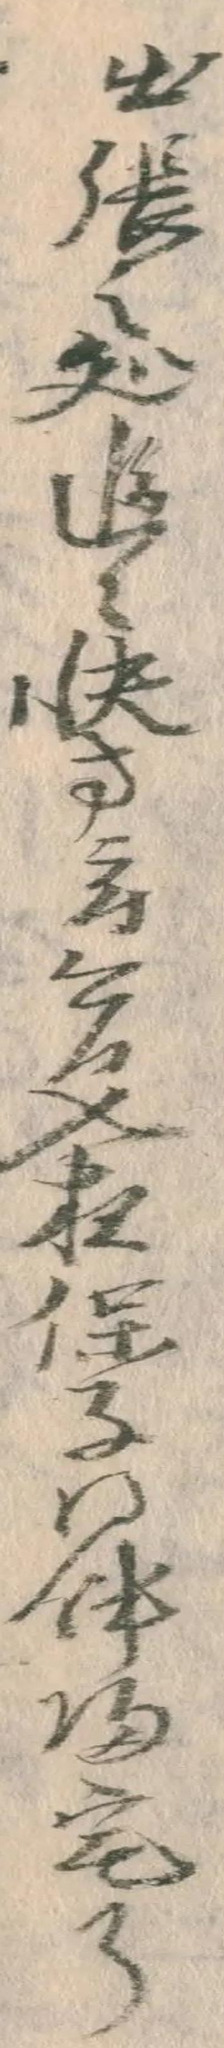出張之処追々決方ニ付今日入夜保子同伴帰宅了
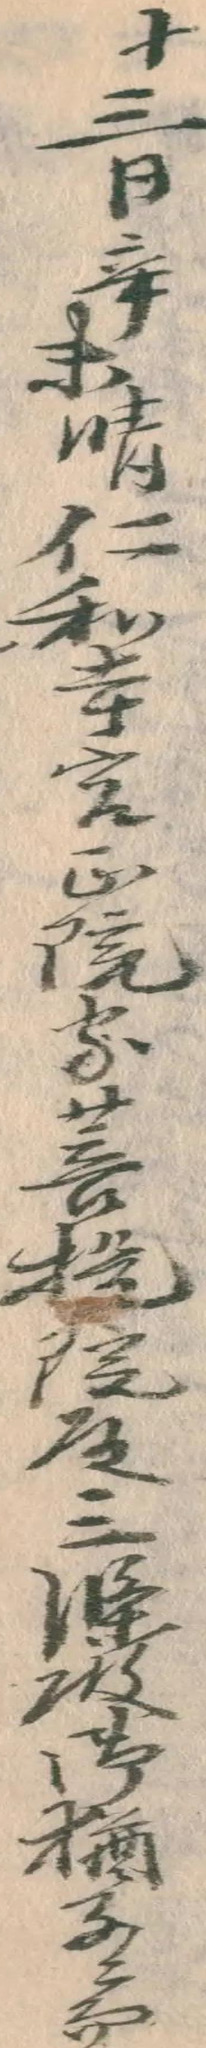十三日辛未晴仁和寺宮正院家菩提院殿三條殿御猶子ニ而
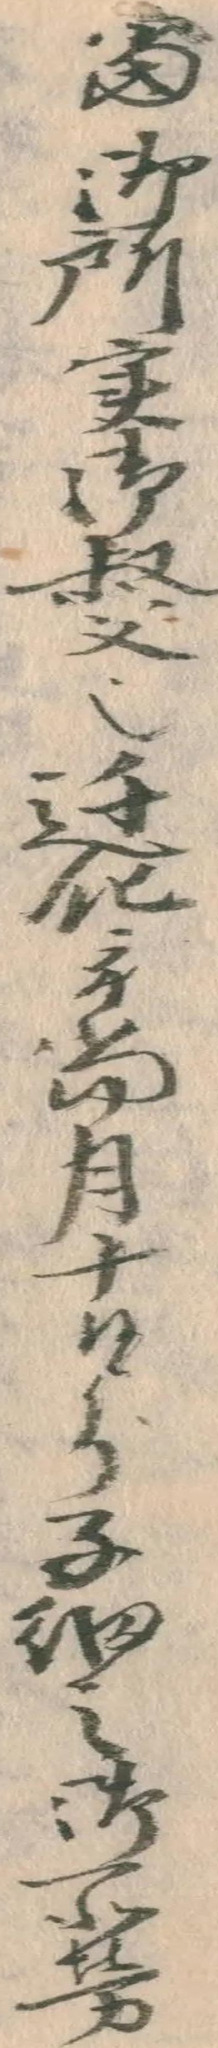當御所実御叔父也遷化ニ付當月十日より子細之御所労
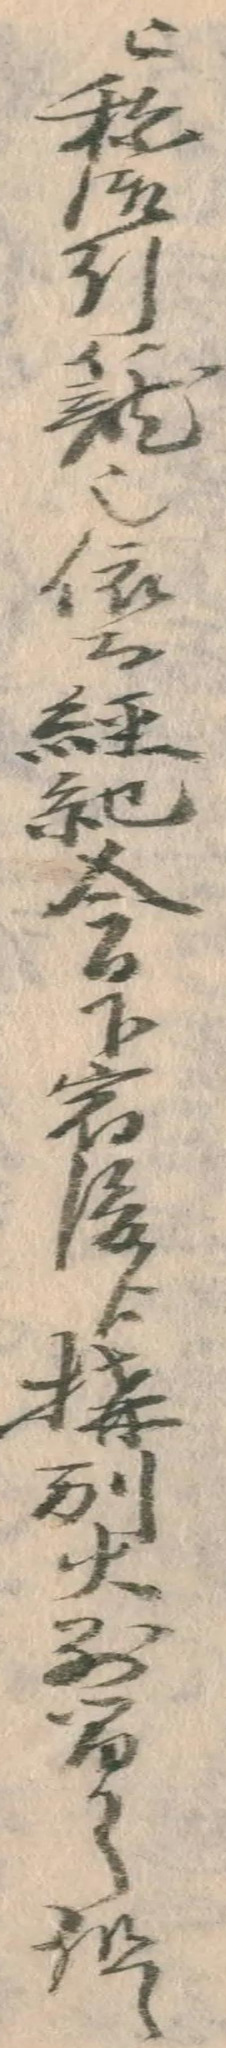被称御引籠也依而経紀今日下宿後ゟ構別火別間了但し
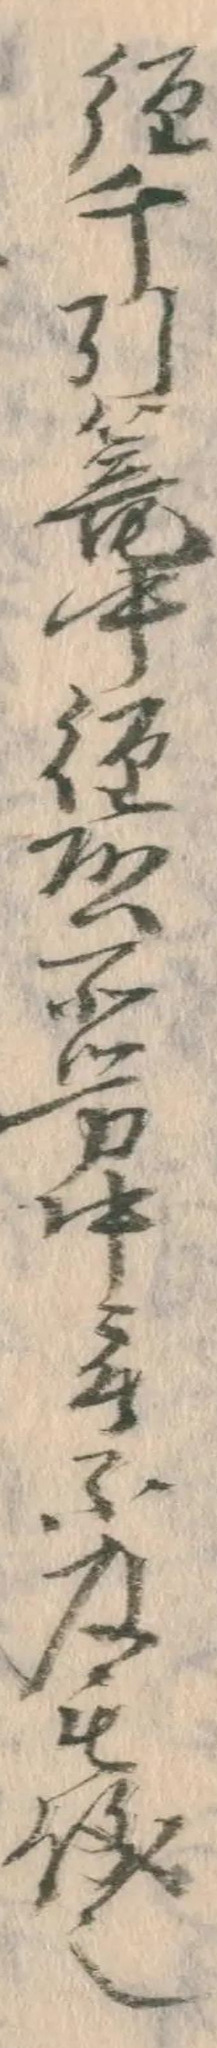経千引篭中経啓所労中ニ付不及其儀也
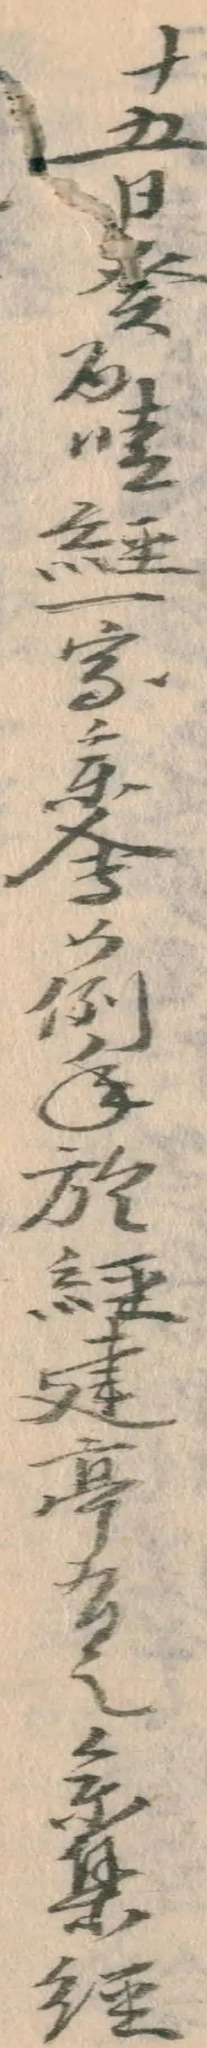十五日癸酉晴経一家参會如例年於経建亭有之参集経
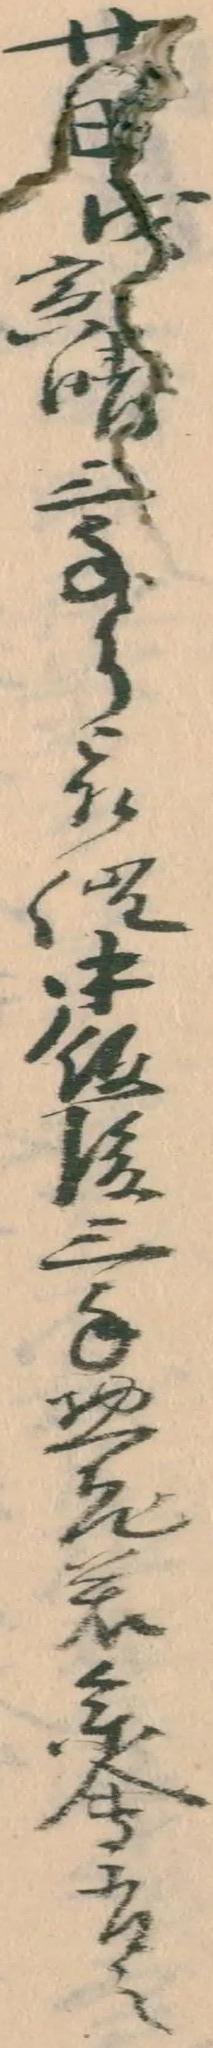廿日戊寅晴三手より若役中飯後三手惣老若参會有之
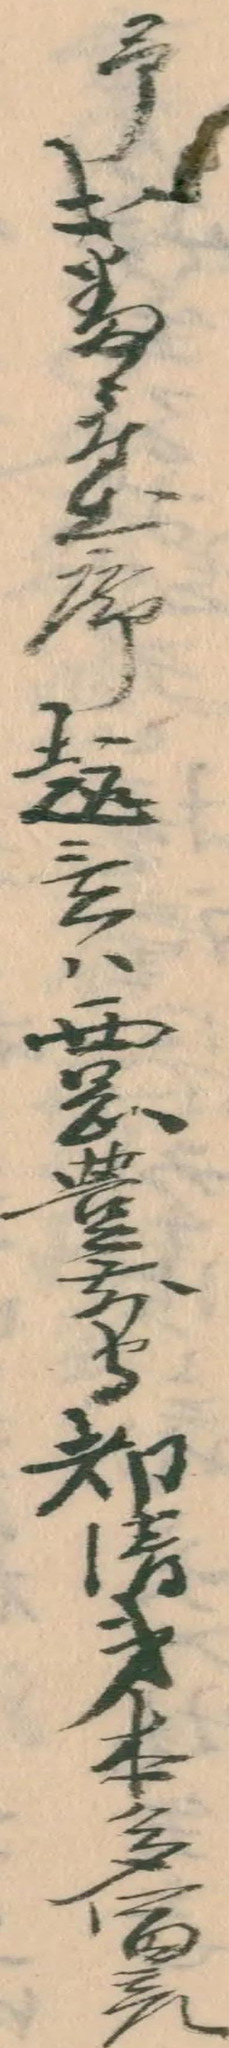予出番ニ付出席趣意ハ西岡豊前守都清弟本多富彦
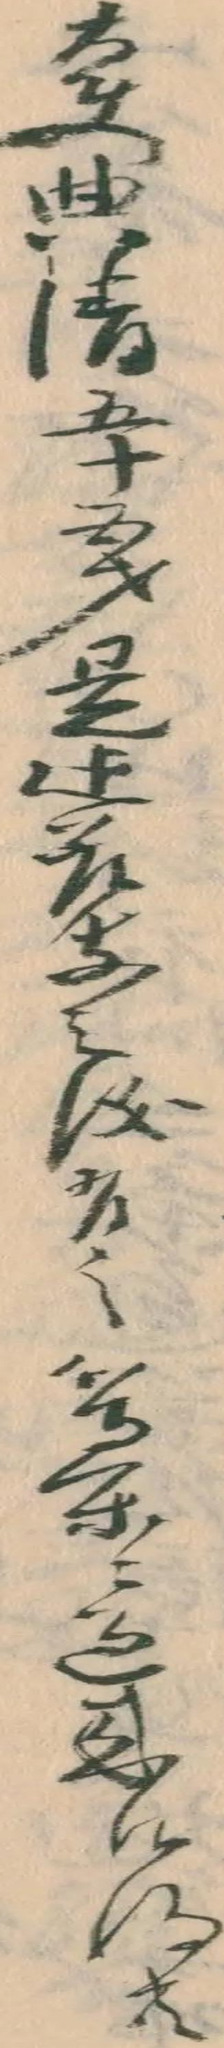大夫典清五十五才是迄差支之儀有之等閑ニ過来候得共
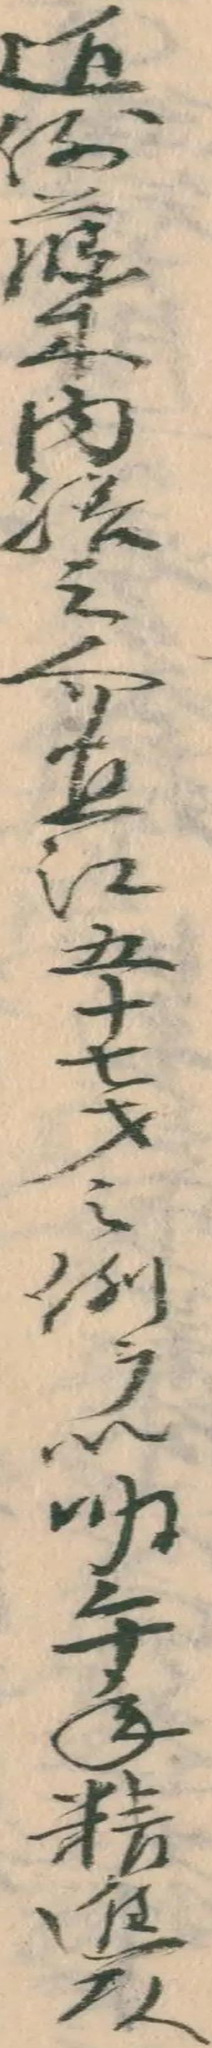近例藤木内膳之介直江五十七才之例を以明午年精進頭
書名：賀茂社記録. 第70冊
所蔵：国立国会図書館 National Diet Library, JAPAN
